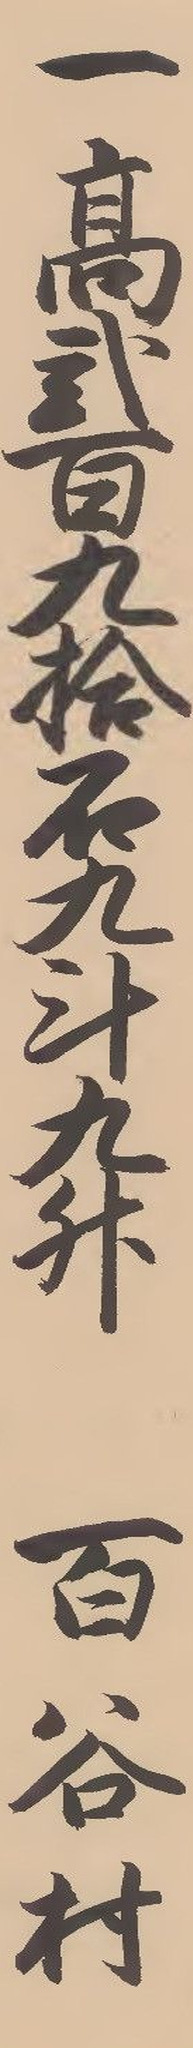一高弐百九拾石九斗九升百谷村
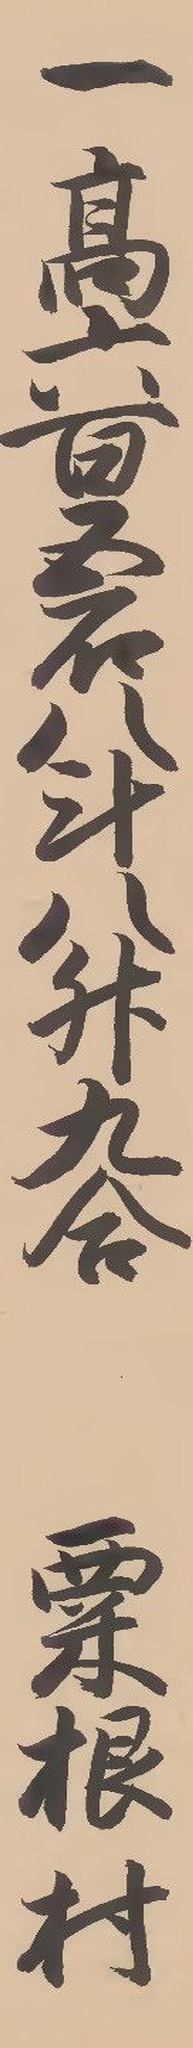一高六百五石八斗八升九合粟根村
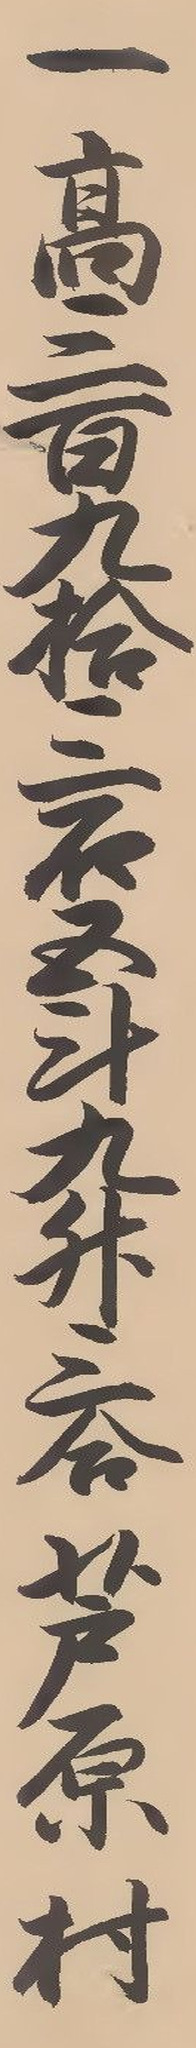一高三百九拾三石五斗九升三合芦原村
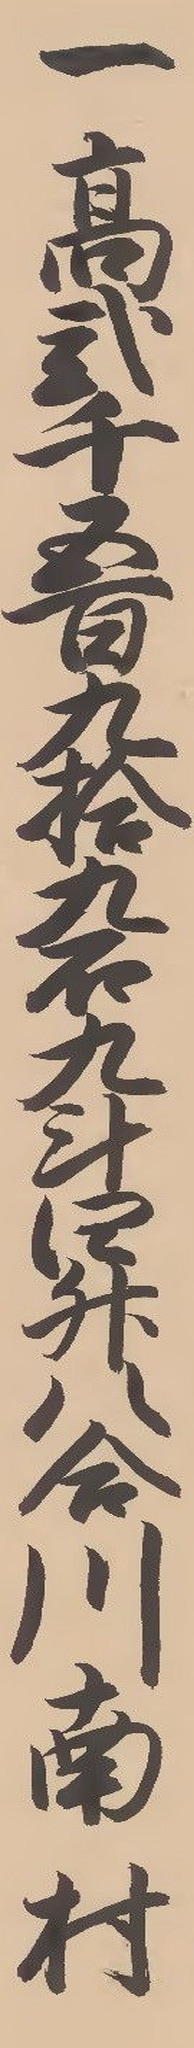一高弐千五百九拾九石九斗四升八合川南村
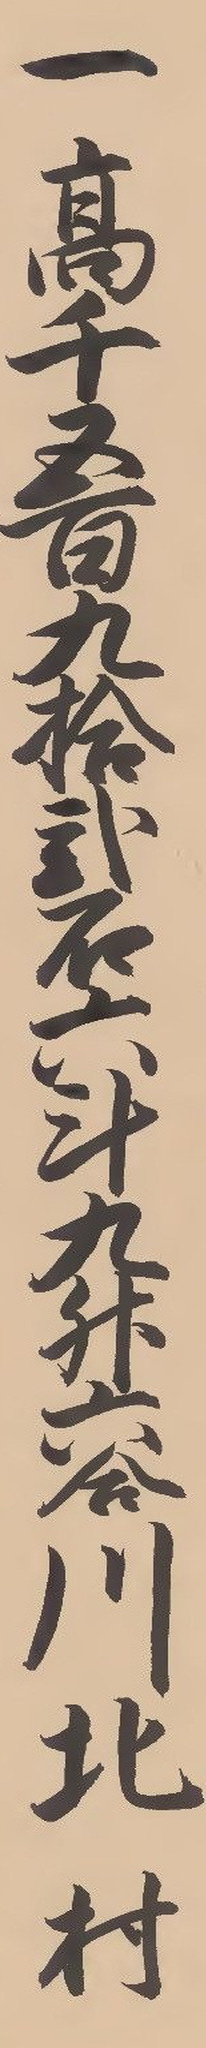一高千五百九拾弐石六斗九升六合川北村
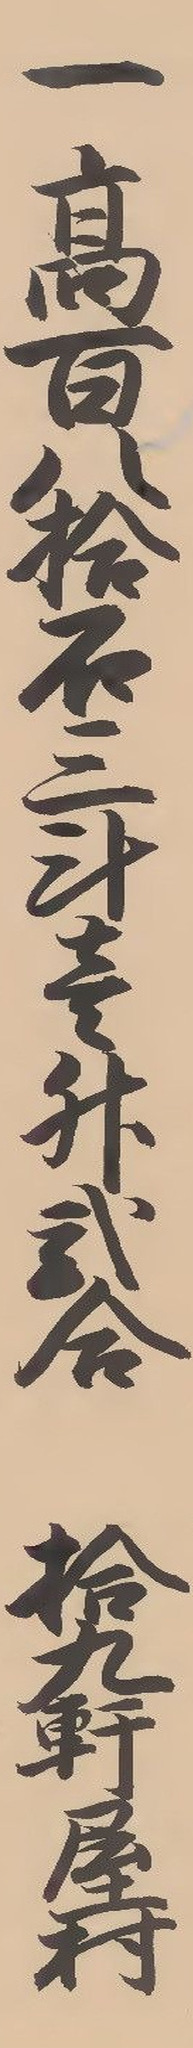一高百八拾石三斗壱升弐合拾九軒屋村
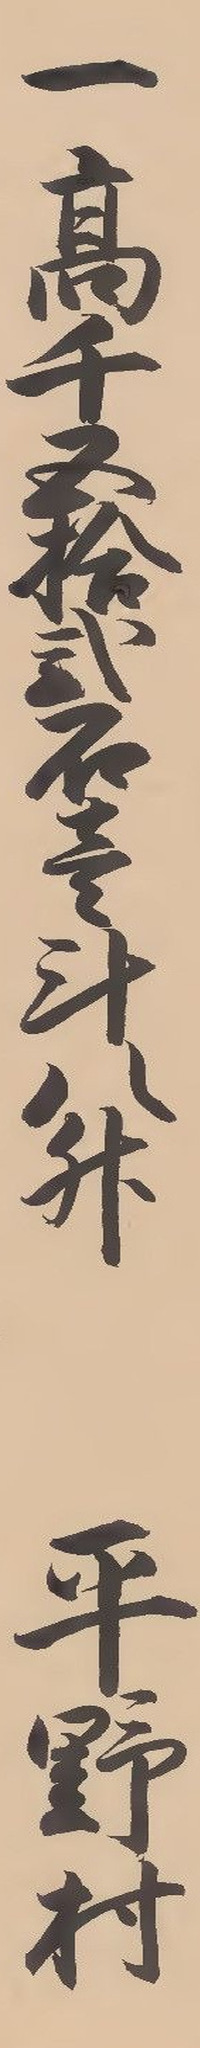一高千五拾弐石壱斗八升平野村
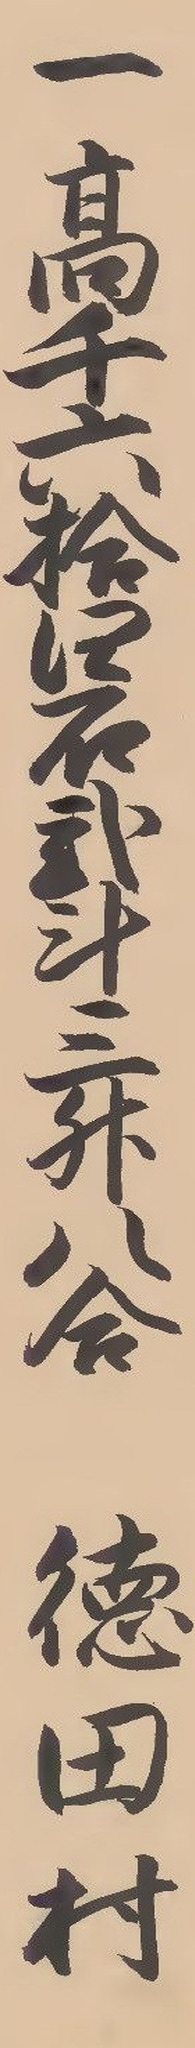一高千六拾四石弐斗三升八合徳田村

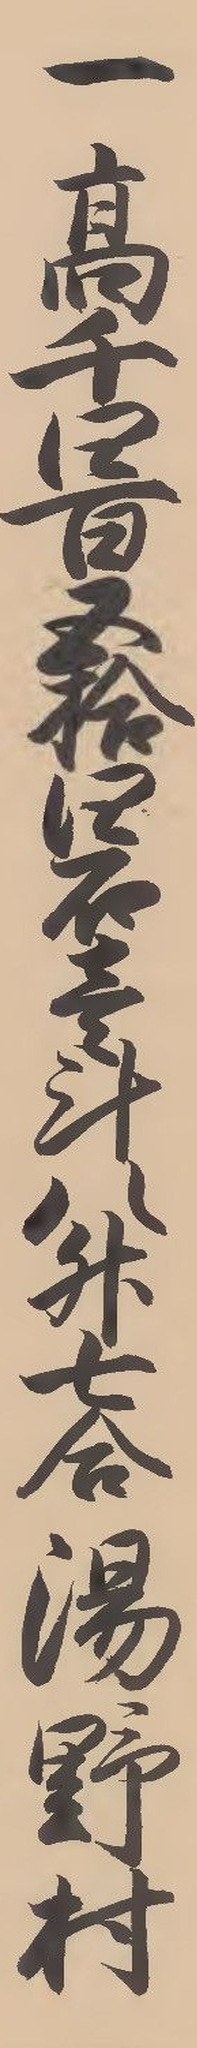一高千四百五拾四石壱斗八升七合湯野村
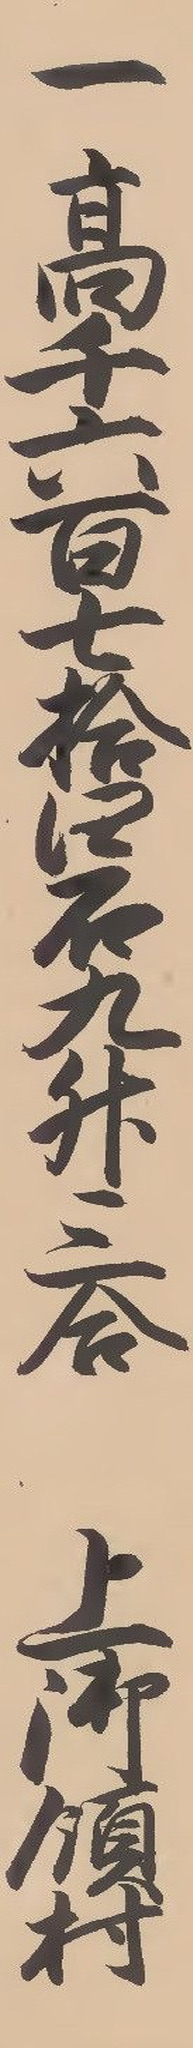一高千六百七拾四石九升三合上御領村
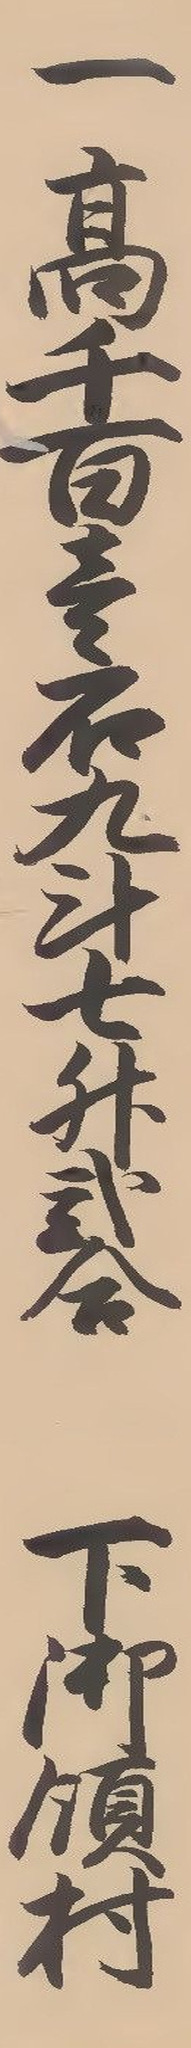一高千百壱石九斗七升弐合下御領村
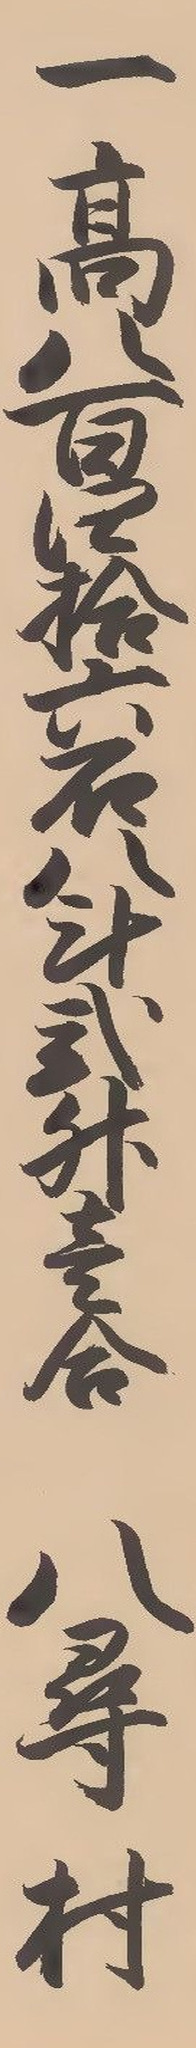一高八百四拾六石八斗弐升壱合八尋村
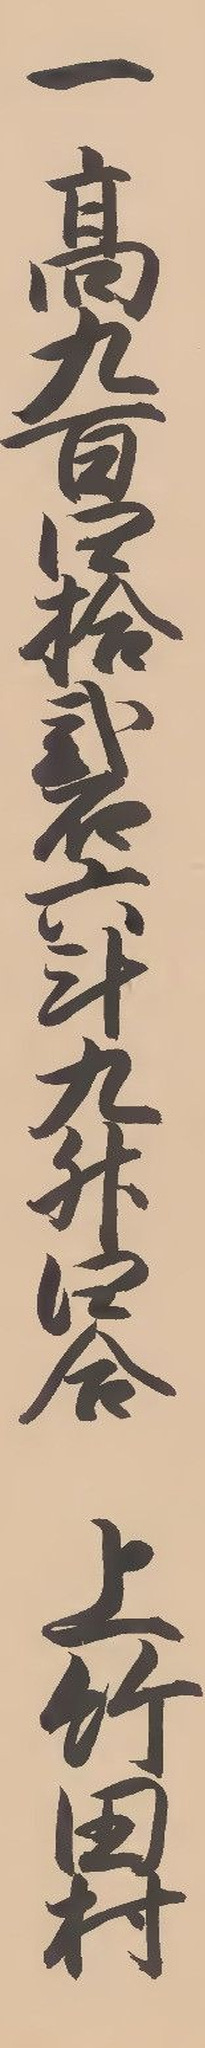一高九百四拾弐石六斗九升四合上竹田村
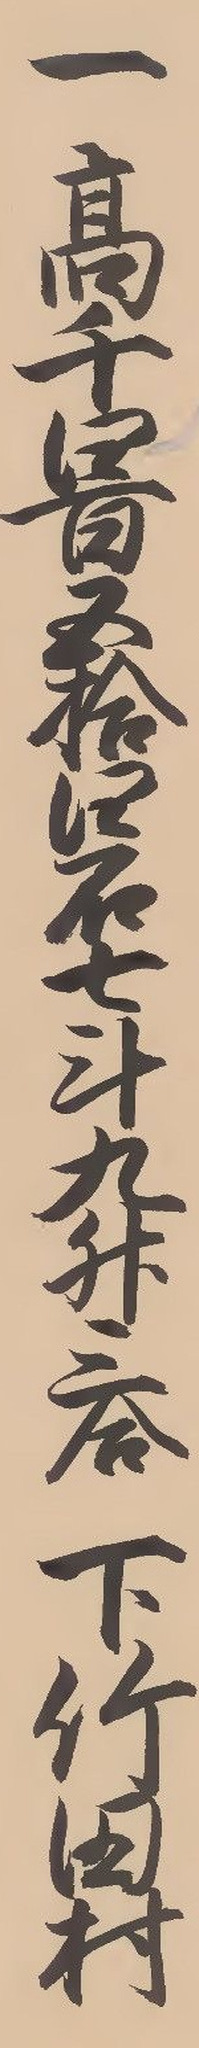一高千四百五拾四石七斗九升三合下竹田村
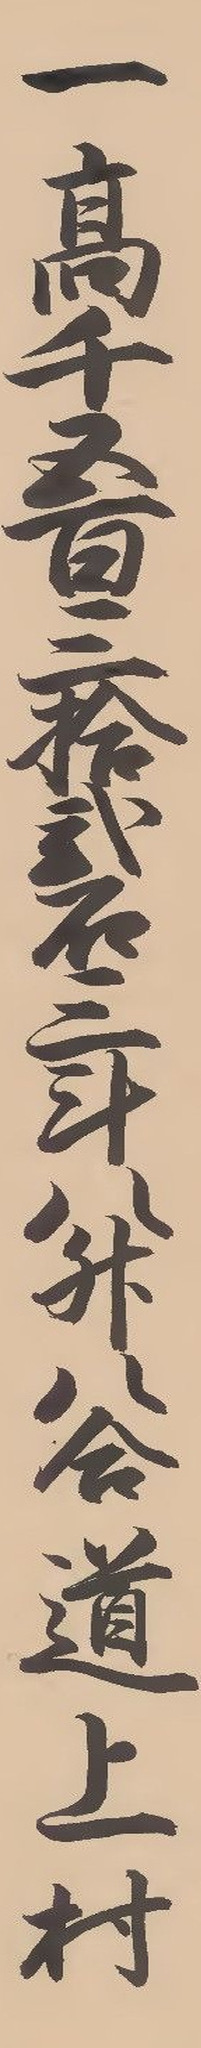一高千五百三拾弐石三斗八升八合道上村
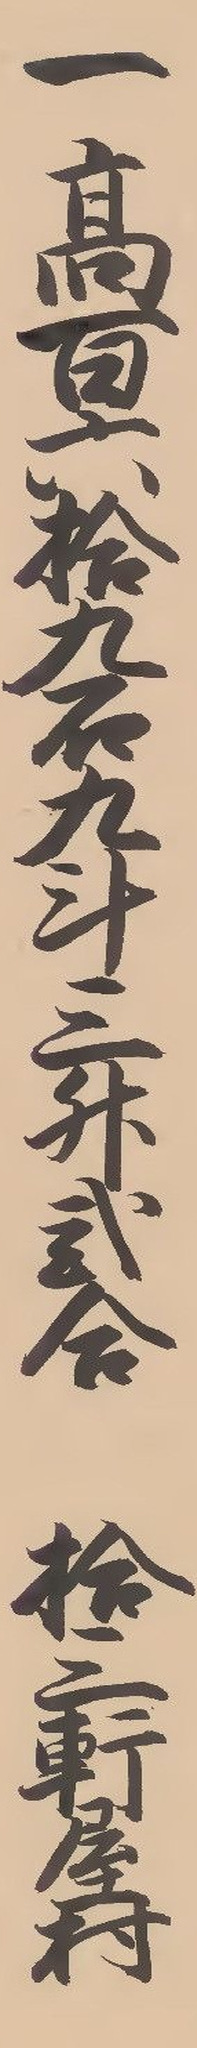一高百六拾九石九斗三升弐合拾三軒屋村
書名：備後国郷帳
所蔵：国立公文書館 National Archives of Japan
